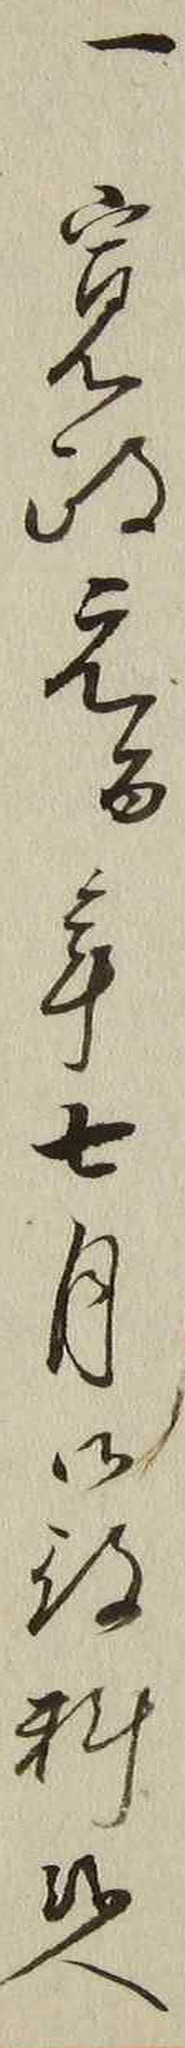一寛政元酉年七月御役料弐人
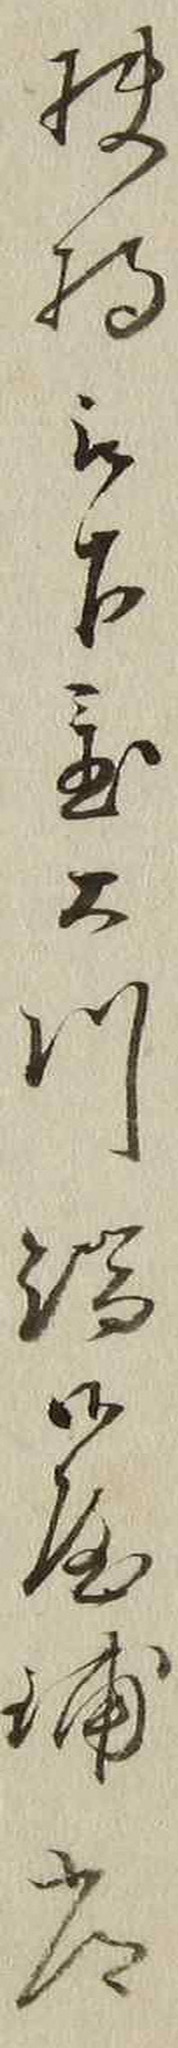扶持被下置大川端御屋鋪常
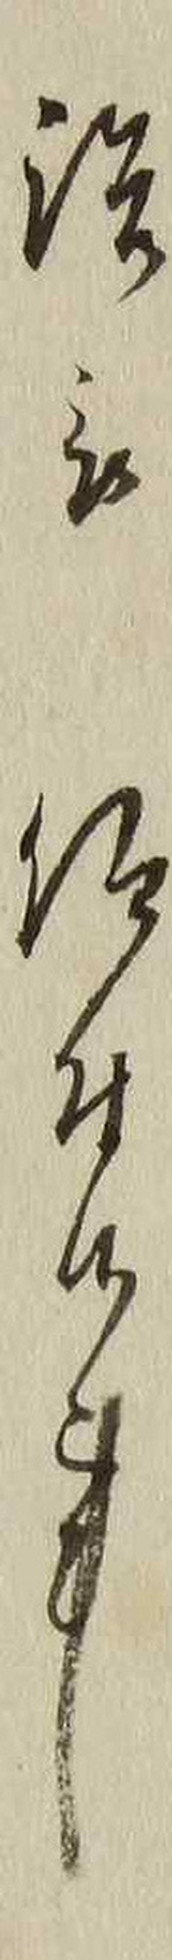詰被仰付候事
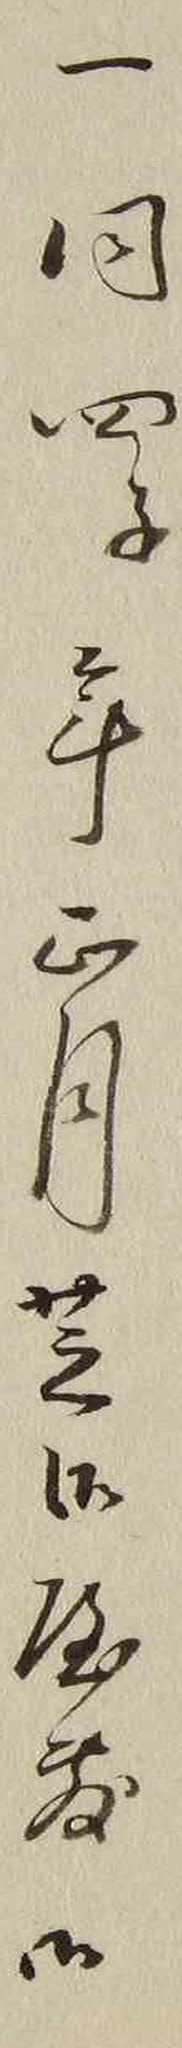一同四子年正月芝御屋敷御
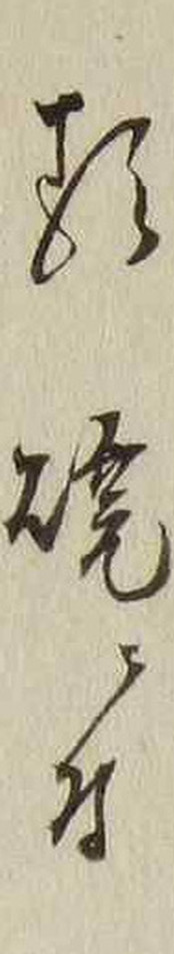類焼ニ付
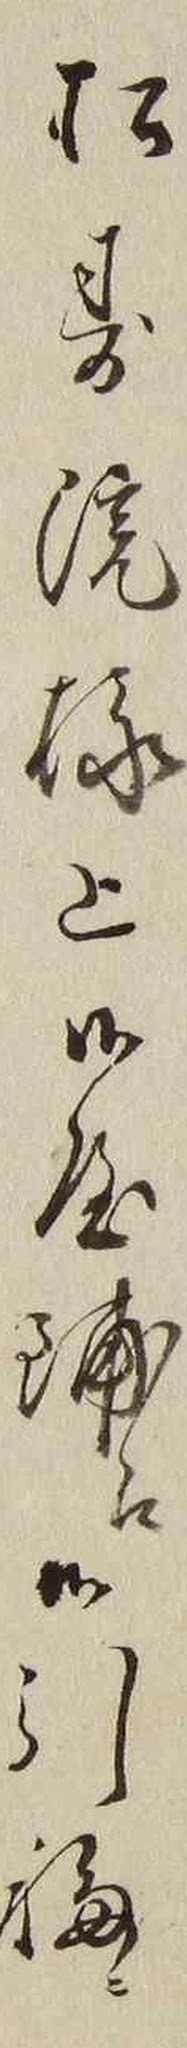松寿院様上屋鋪江御引移ニ
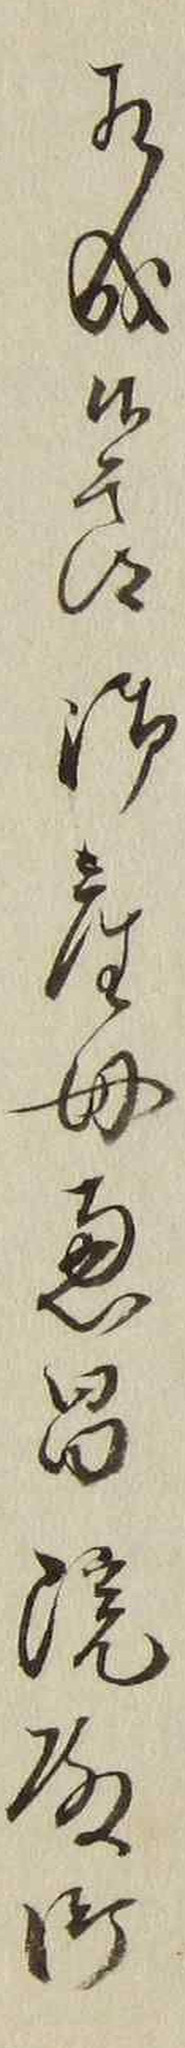相成候節御産母恵昌院殿御
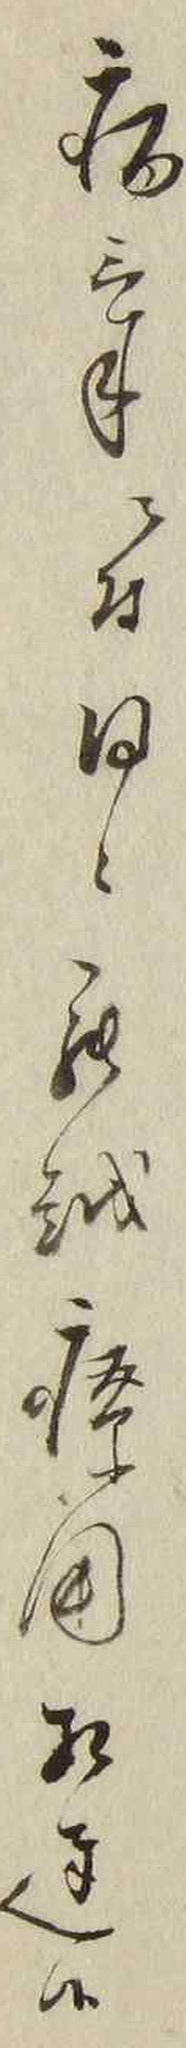病気ニ付日々罷越療用相達候
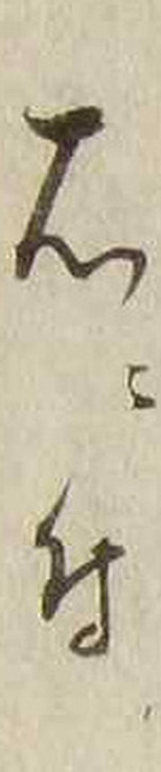右ニ付

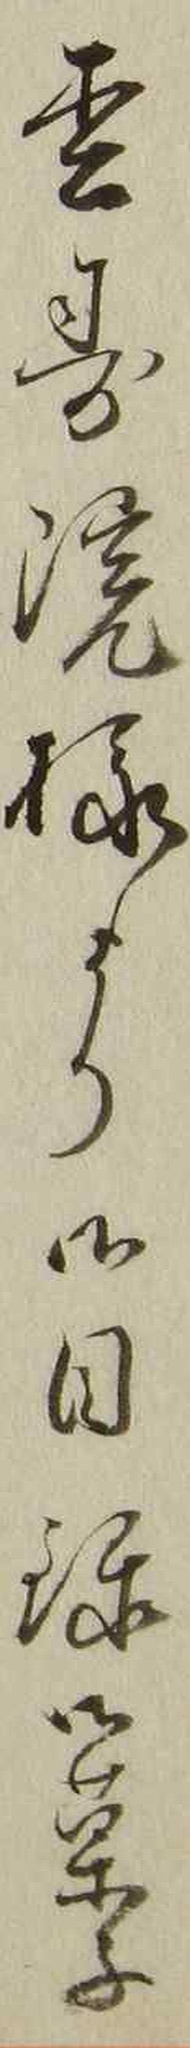松寿院様より御用録御菓子
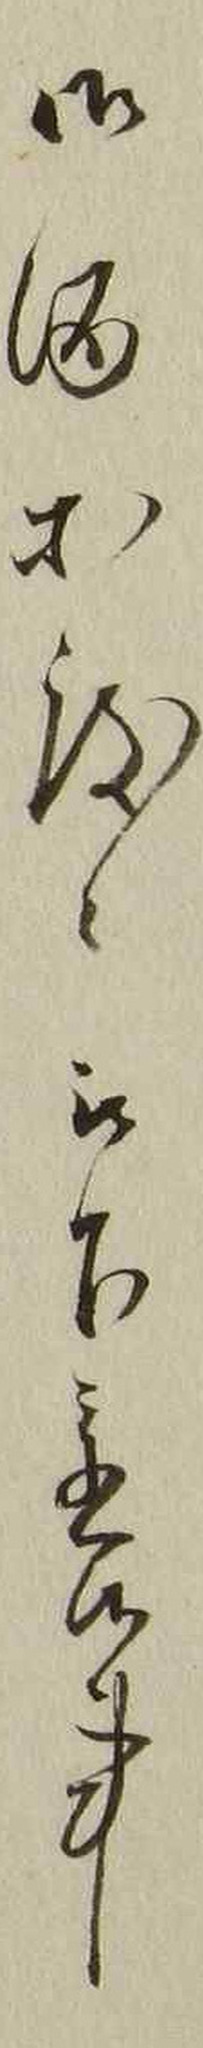御酒等度々被下置候事
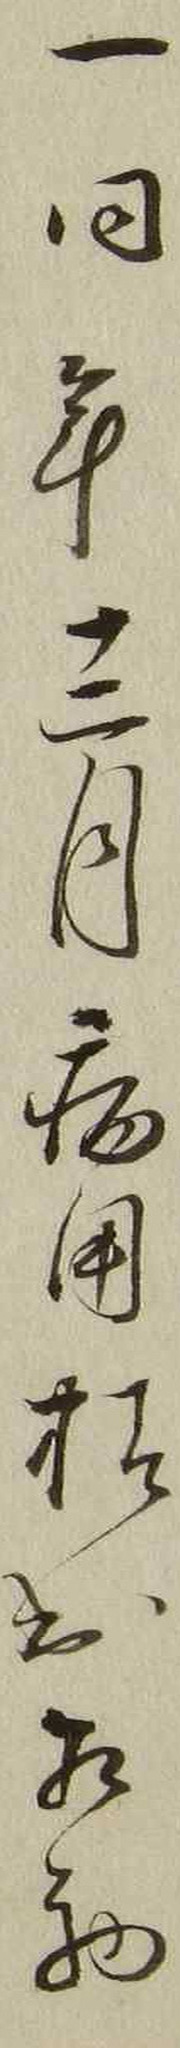一同年十二月病用精出相勤
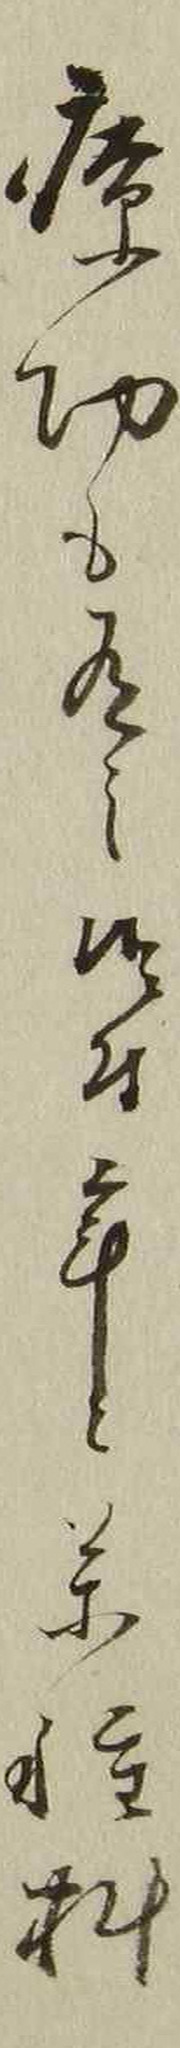療功も有之候ニ付年々薬種料
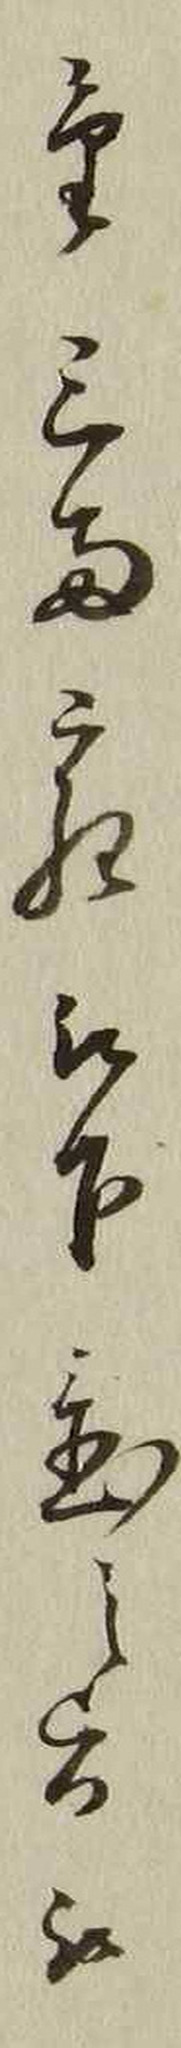金三両宛被下置之方被
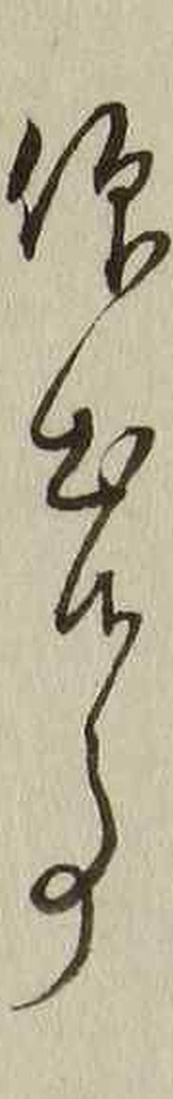仰出候事
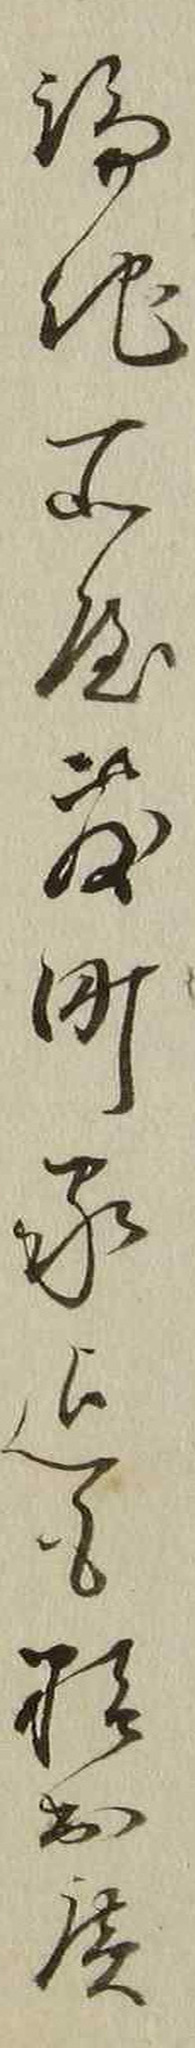論地所屋敷町家迄も精出広
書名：諸士系譜　巻之129　た之部5
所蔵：会津若松市立会津図書館
